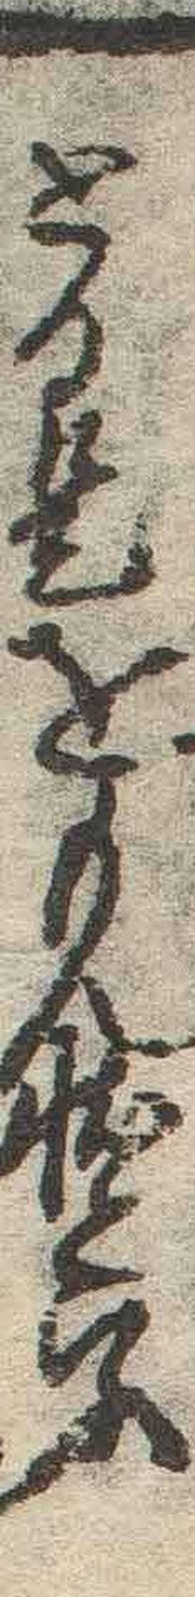とる是をもん状といふ
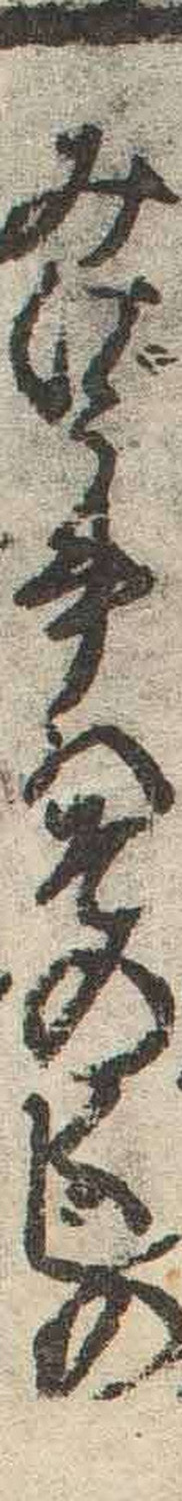みげう書はそのくじの
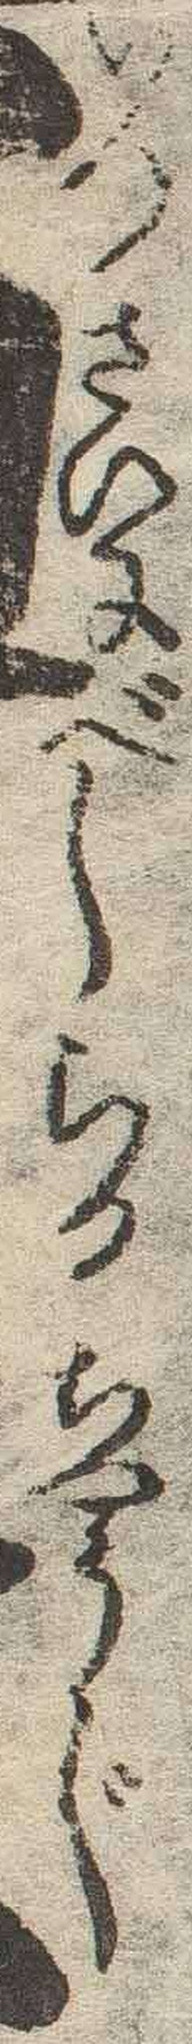いつさいにべしらるちやうじ
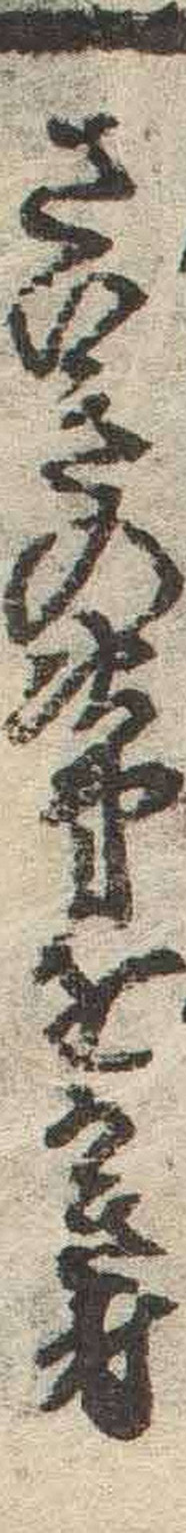さいきの次第をかき付
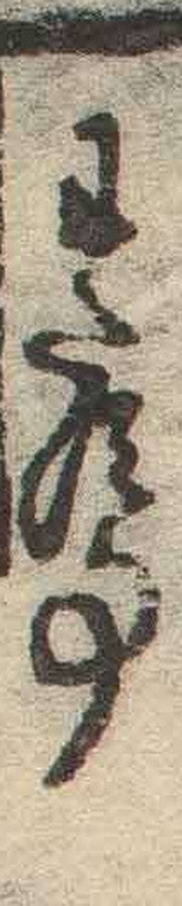わたす事
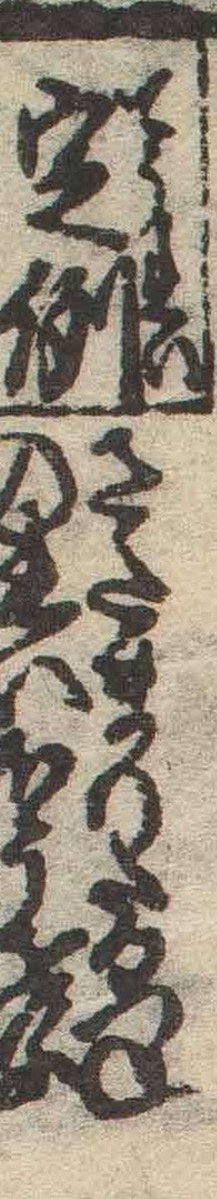定例さたまりたるつね
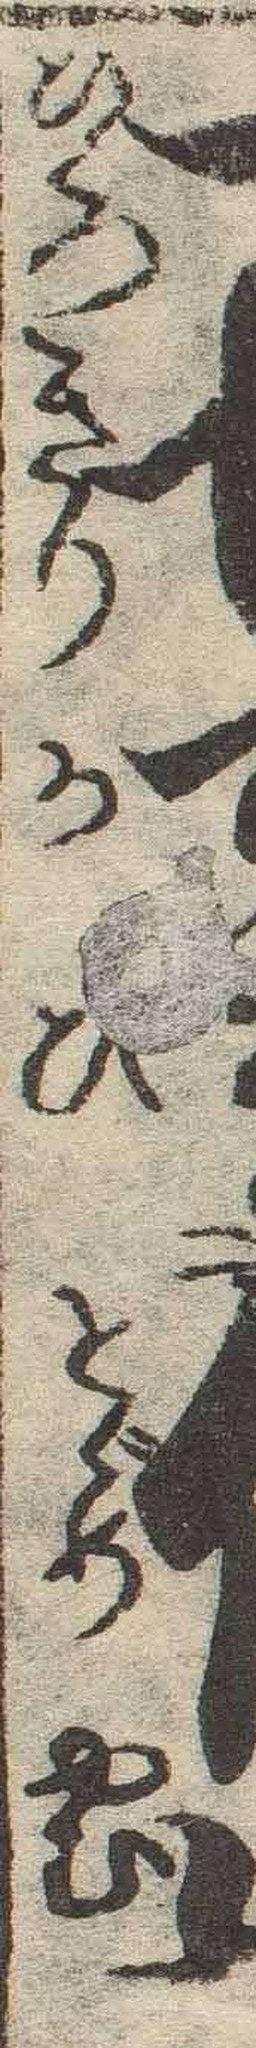ひとつきりかひとゞめやむ
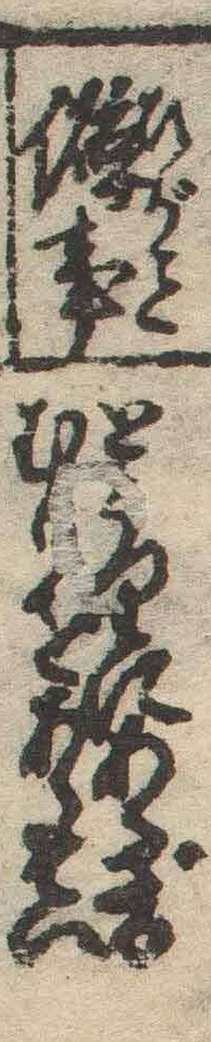僻事とうりにあらざる
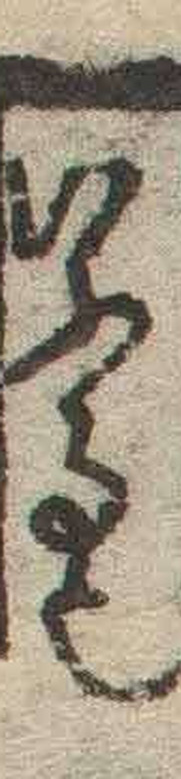いふ事也
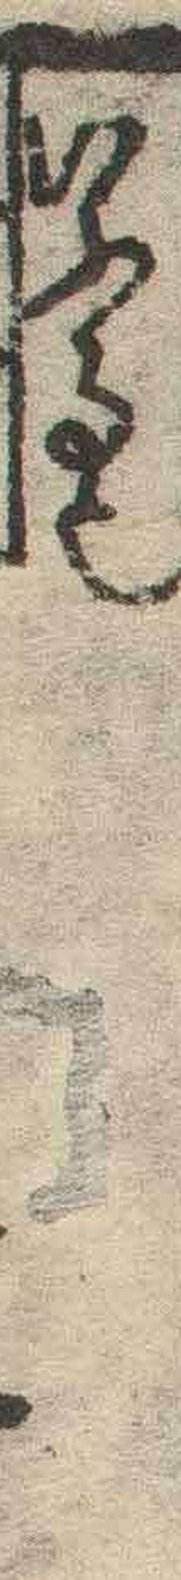いふ事也
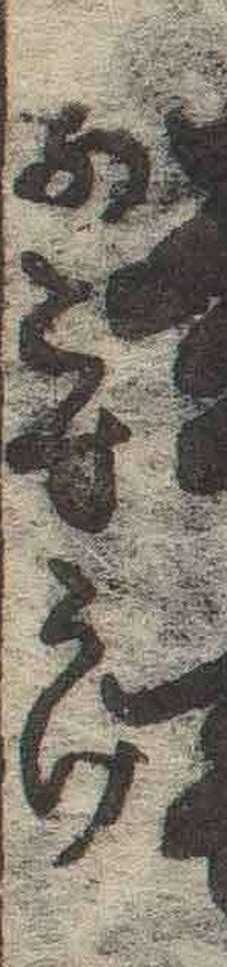おこすうけ
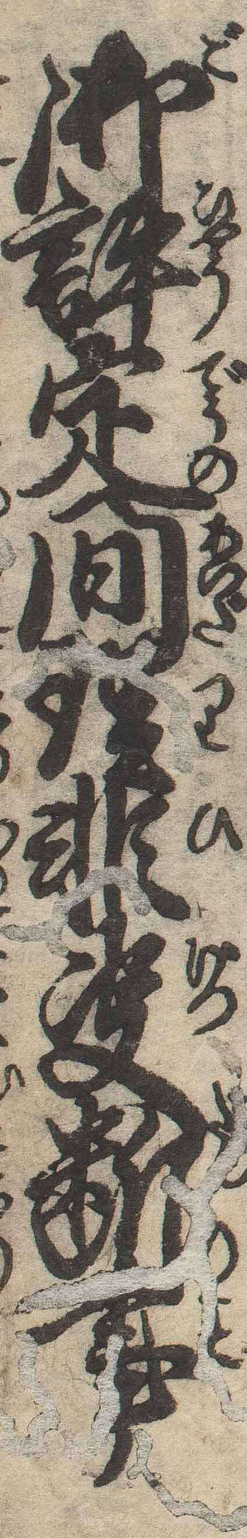御評定間理非決断事
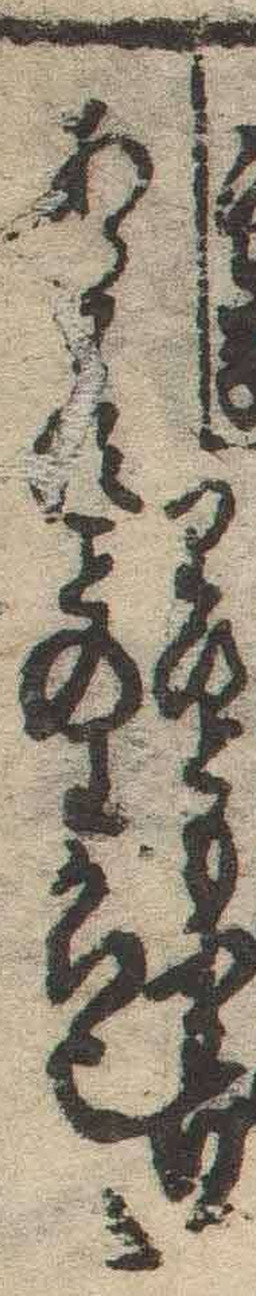あらわすことのわかち也
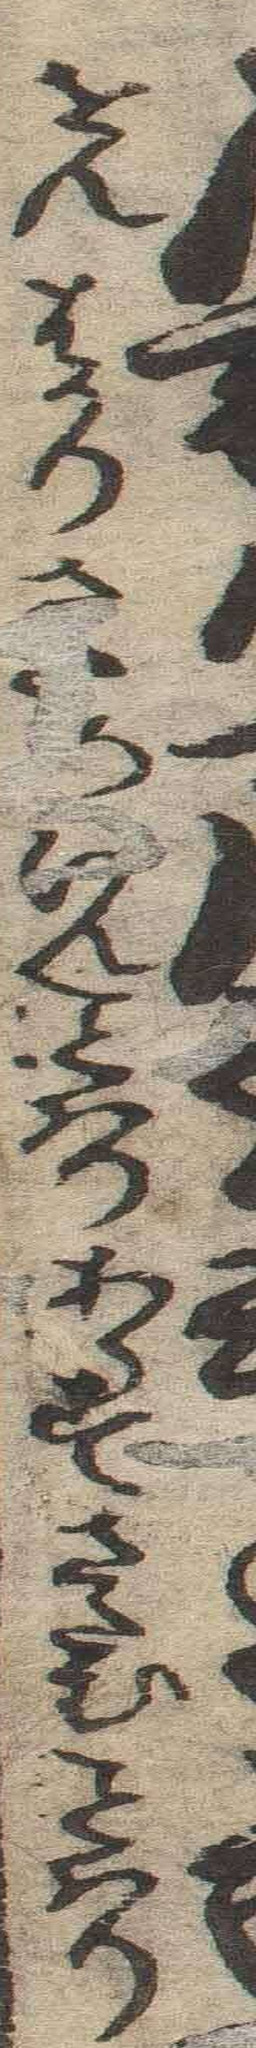をんはかりさためけんことはりあらすさたむことはり

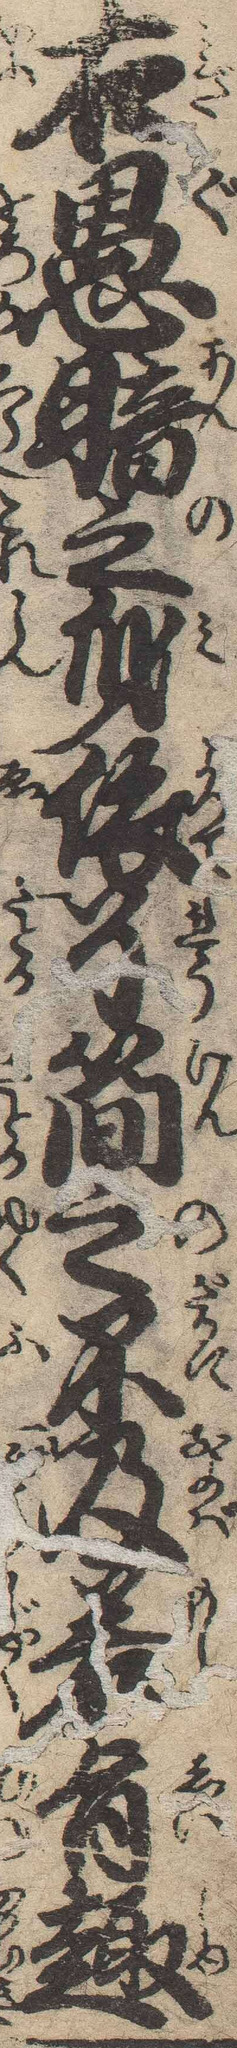右愚暗之身依了簡之不及若旨趣
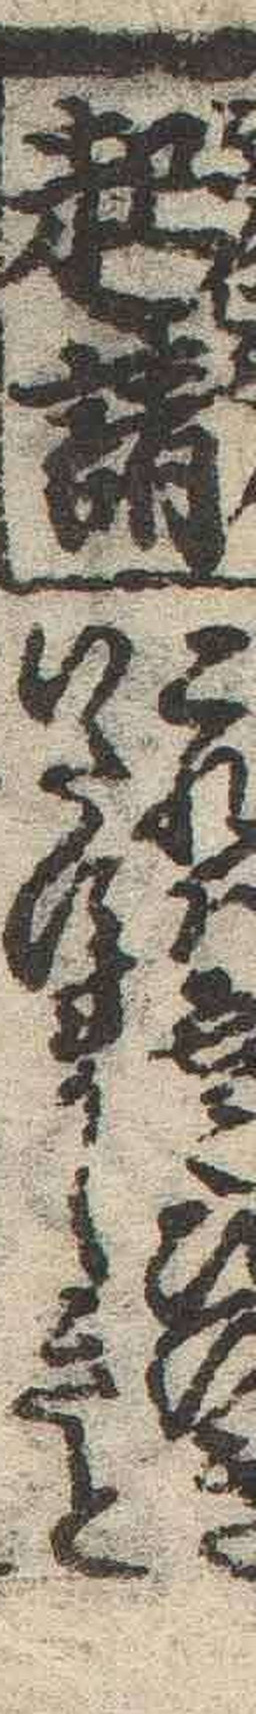いたすましきと
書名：御成敗式目絵抄
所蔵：東京学芸大学附属図書館 国文学研究資料館
